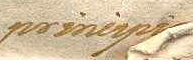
principi
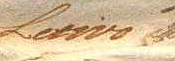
Letivo
